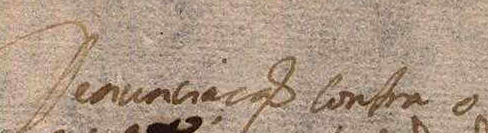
Denunciaçaõ contra o
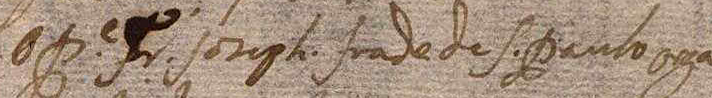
o p.e Fr. jozeph frade de S. paulo orga
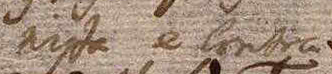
nista e contra
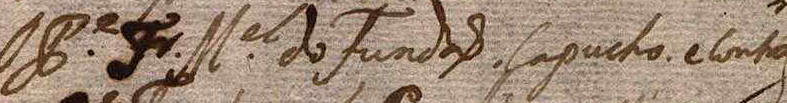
O P.e Fr. M.el do Fundaõ Capucho e contra
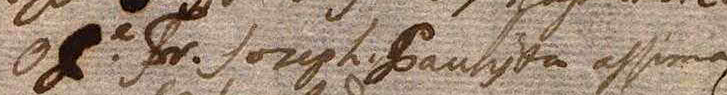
O P.e Fr. Jozeph Paulista assima
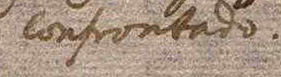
confrontado.
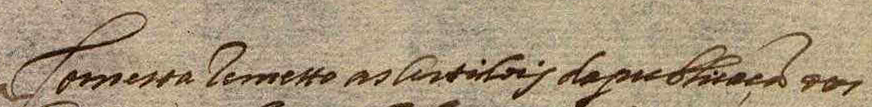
Com esta Remetto as certidois da publicaçaõ dos
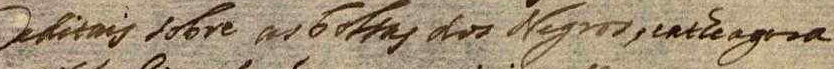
editais sobre as bolsas dos Negros, e athe agora
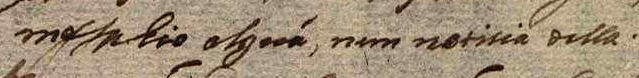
me sahio alguā, nem noticia della.
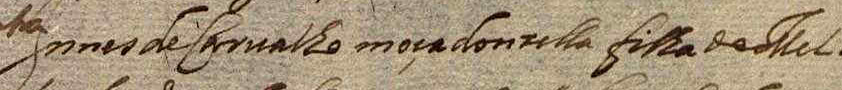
Jnnes de Carualho moça donzella filha de Mel
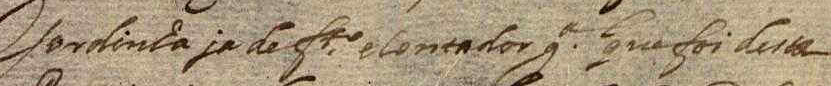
sordinha ja def.to e Contador g.al que foi desta
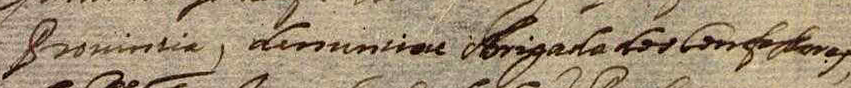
Prouincia, denunciou obrigada dos Confessores,
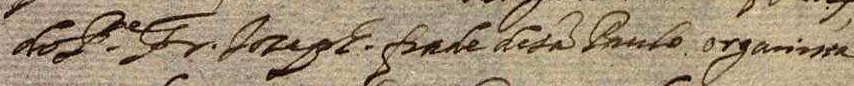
do P.e Fr. Iozeph. frade de saõ Paulo organista
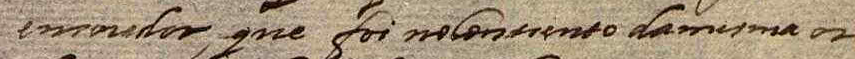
e morador, que foi no Conuento da mesma or
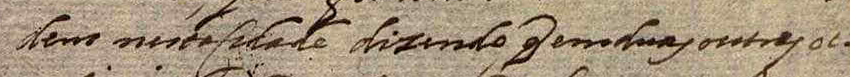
dem nesta Cidade dizendo q̄ em duas ou tres oc
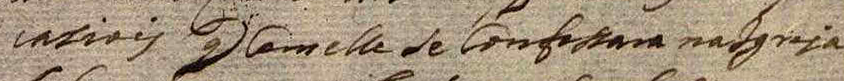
caziois q̄ com elle se confessara na Igreja
